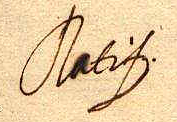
Ratif.
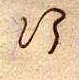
13
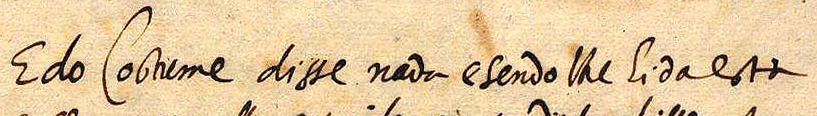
E do Costume disse nada e sendo lhe lida esta
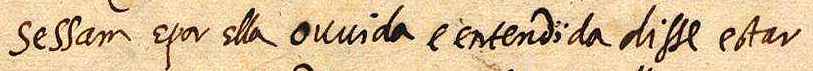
sessam E por Ella ouuida e entendida disse estar
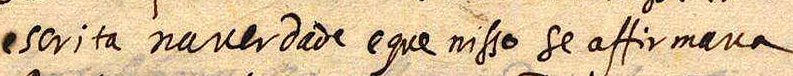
escrita na uerdade e que nisso se affirmaua
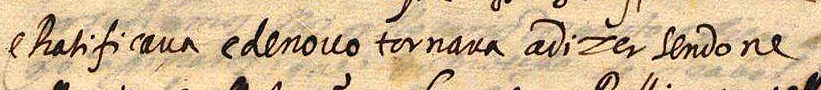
e Ratificaua e de nouo tornaua a dizer sendo ne
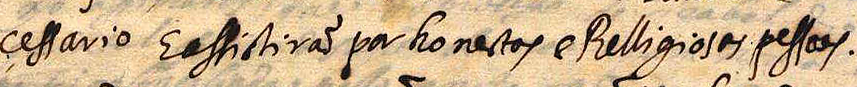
cessario E assistiraõ por honestas e Relligiosas pessoas.
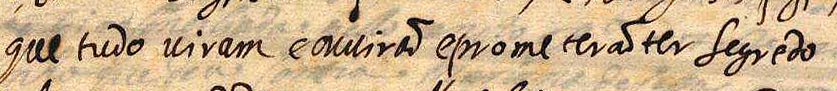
que tudo uiram e ouuirão e prometeraõ ter segredo
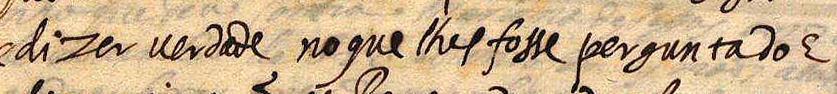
e dizer uerdade no que lhes fosse perguntado E
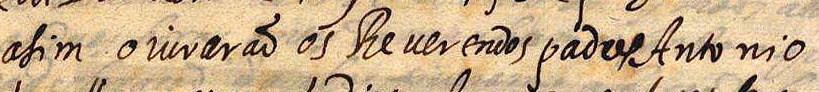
asim o iuraraõ os Reuerendos padres Antonio
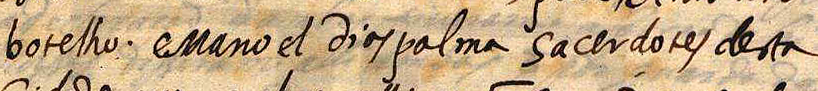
botelho. e Manoel dias palma sacerdotes desta
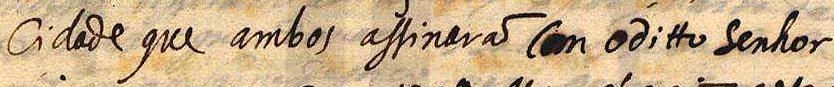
Cidade que ambos assinaraõ com o ditto Senhor
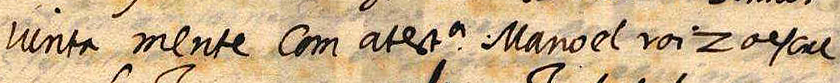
iuntamente com a testa. Manoel roiz o escre
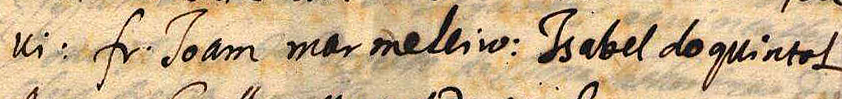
ui: fr. Ioam marmeleiro: Isabel do quintaL
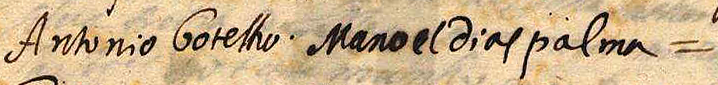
Antonio botelho. Manoel dias palma =
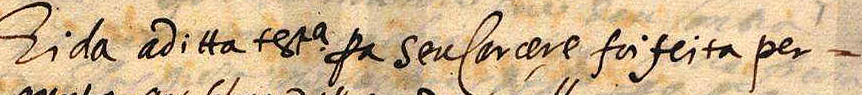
E ida a ditta testa. ꝑa seu Carcere foi feita per
